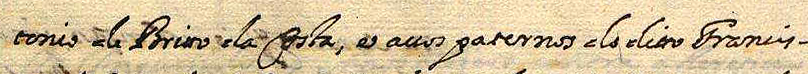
tonio de Britto da Costa, e auos paternos do ditto Francis
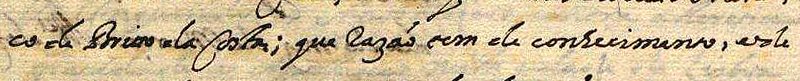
co de Britto da Costa; que Razaõ tem de conhecimento, e de
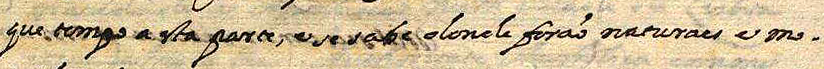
que tempo a esta parte, e se sabe donde foraõ naturaes e mo
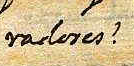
radores?
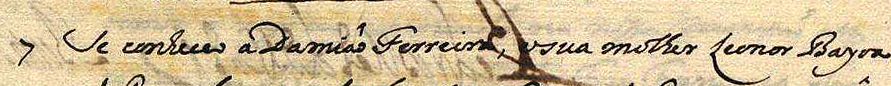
7 Se conheceo a Damiaõ Ferreira, e sua molher Leonor Bayoa
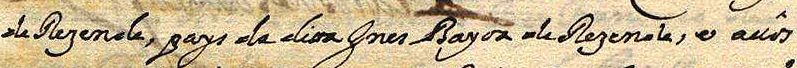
de Rezende, pays da ditta Jnes Bayoa de Rezende, e auôs
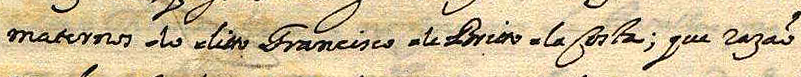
maternos do ditto Francisco de Britto da Costa; que razaõ
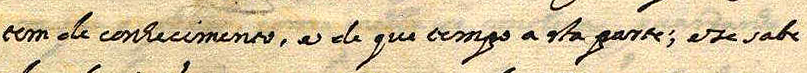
tem de conhecimento, e de que tempo a esta parte; e se sabe
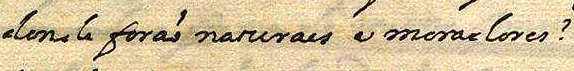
donde foraõ naturaes e moradores?
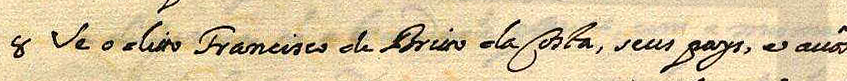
8 Se o ditto Francisco de Britto da Costa, seus pays, e auôs
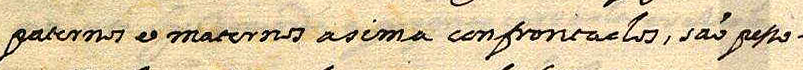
paternos e maternos asima confrontados, saõ pesso
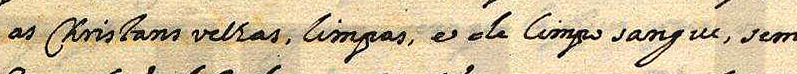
as Christans velhas, limpas, e de limpo sangue, sem
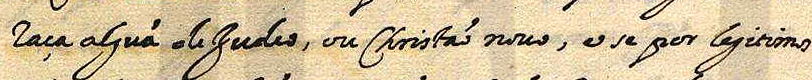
Raça alguā de Judeo, ou Christaõ nouo, e se por legitimos
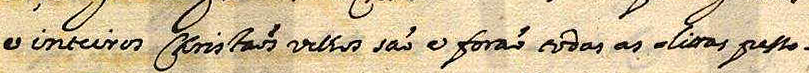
e inteiros Christaõs velhos saõ e foraõ todas as dittas pesso
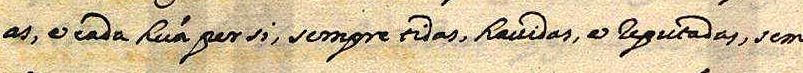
as, e cada huā per si sempre tidas, hauidas, e Reputadas, sem
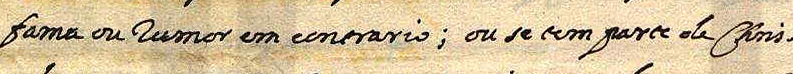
fama, ou Rumor em contrario; ou se tem parte de Chris
